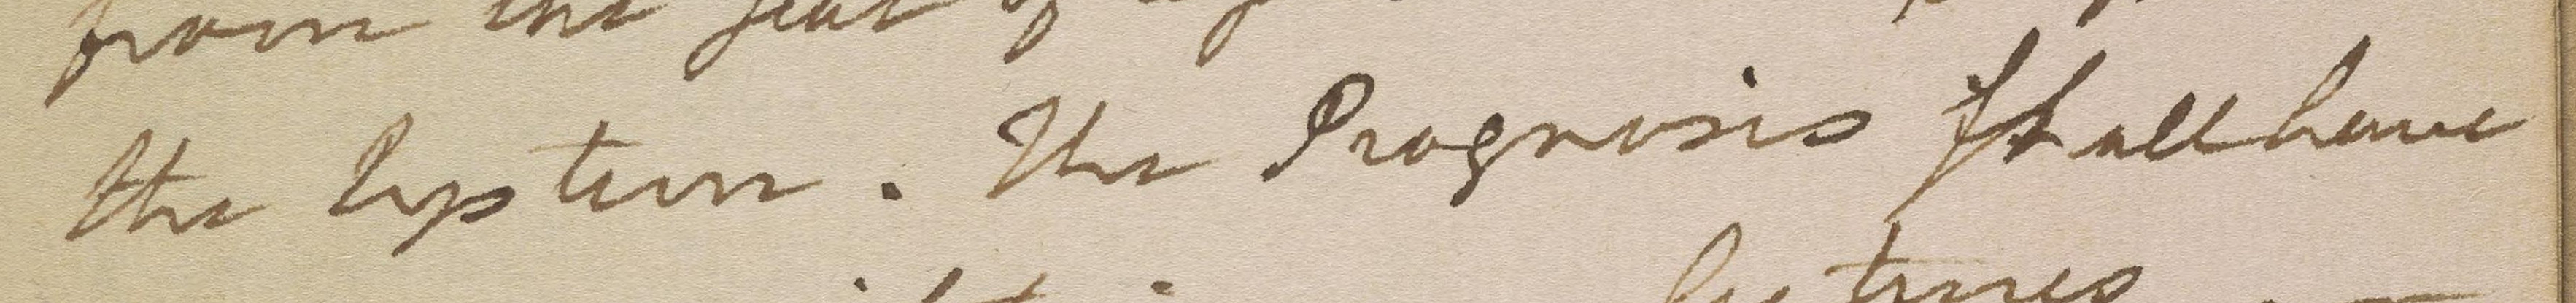the system. The Prognosis shall have
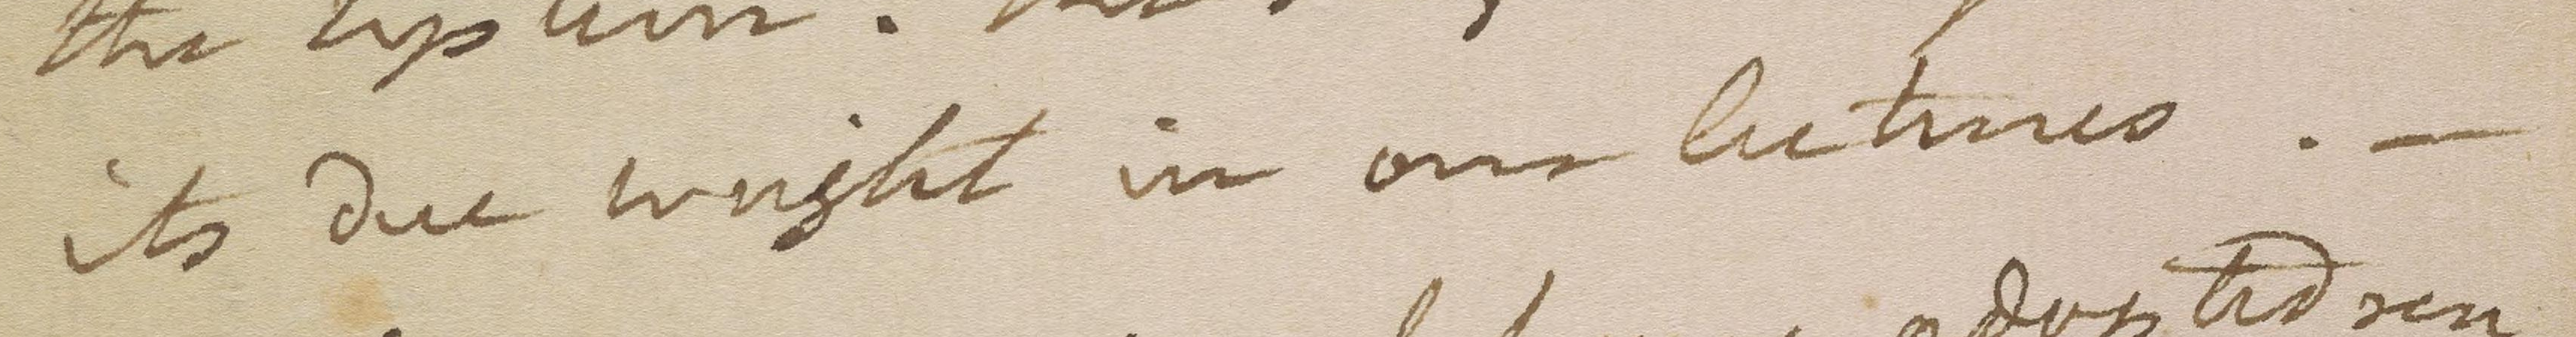its due weight in our lectures.-
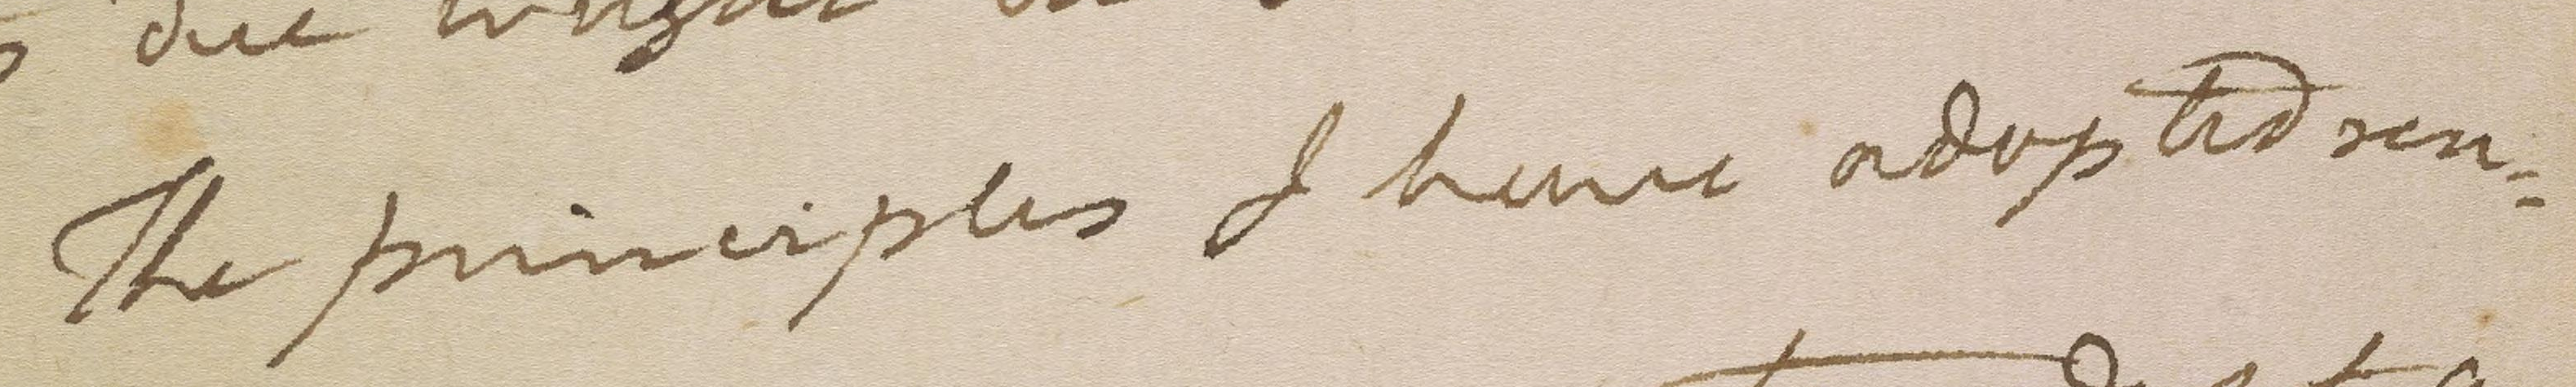The principles I have adopted ren-
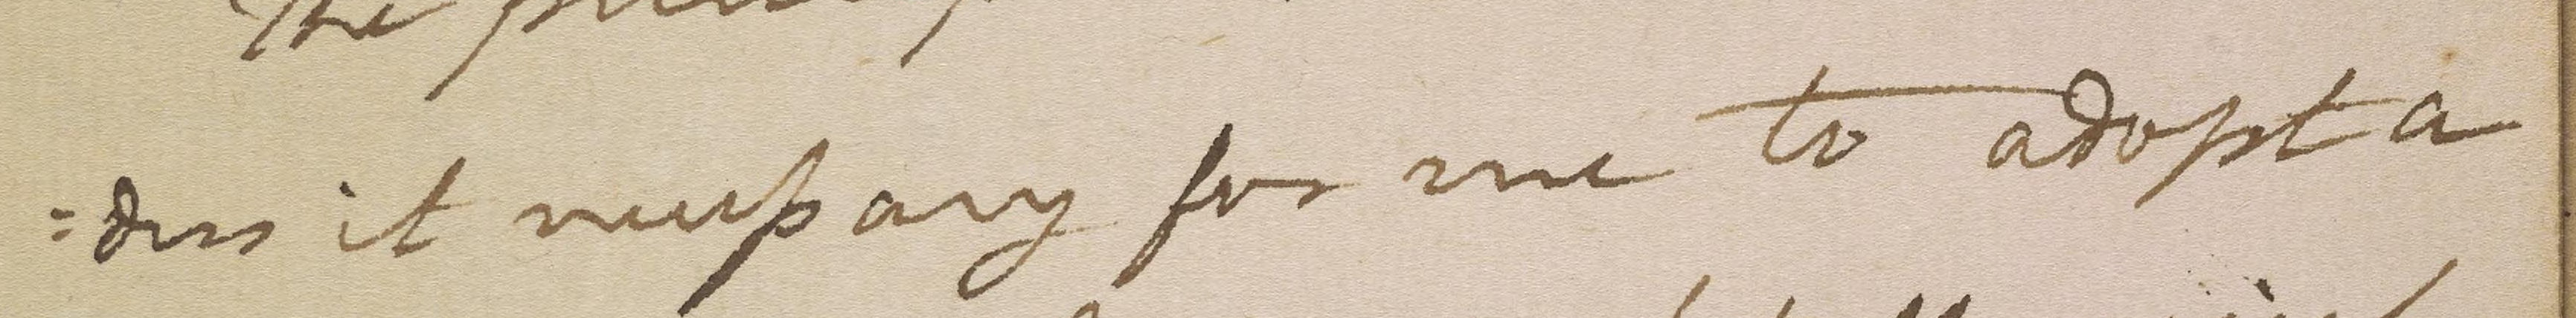-der it necessary for me to adopt a
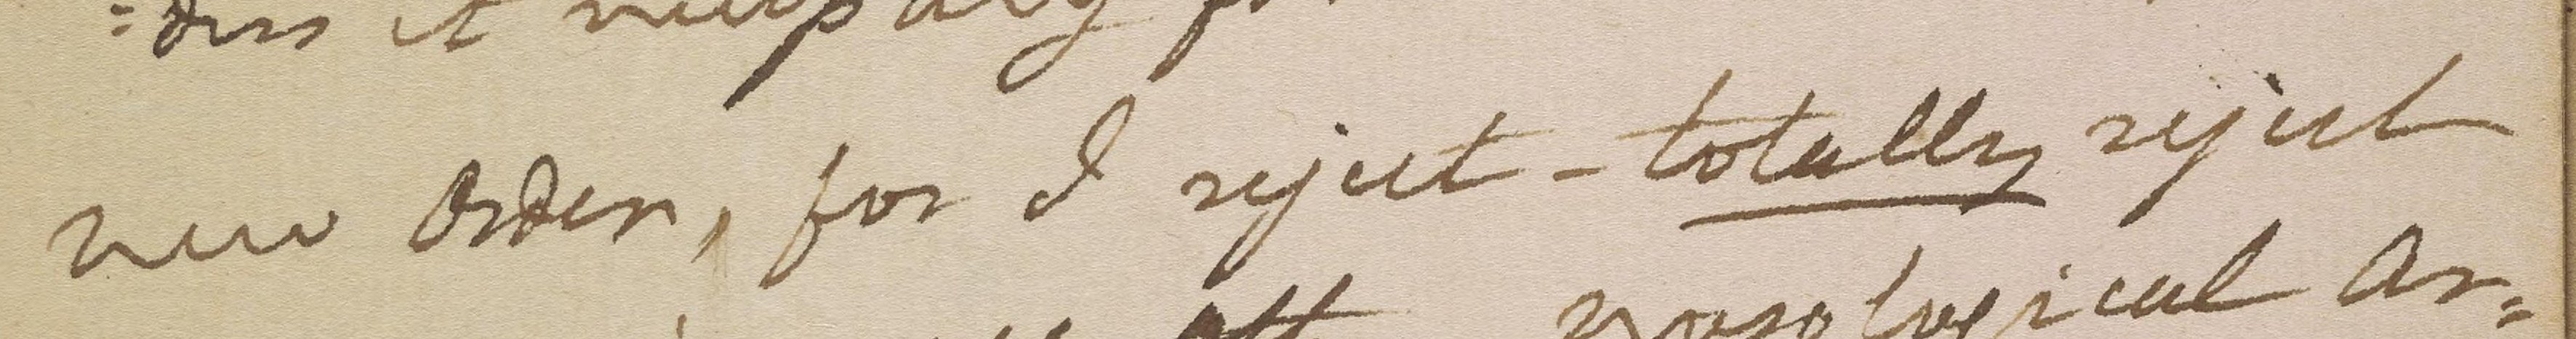new order, for I reject- totally reject
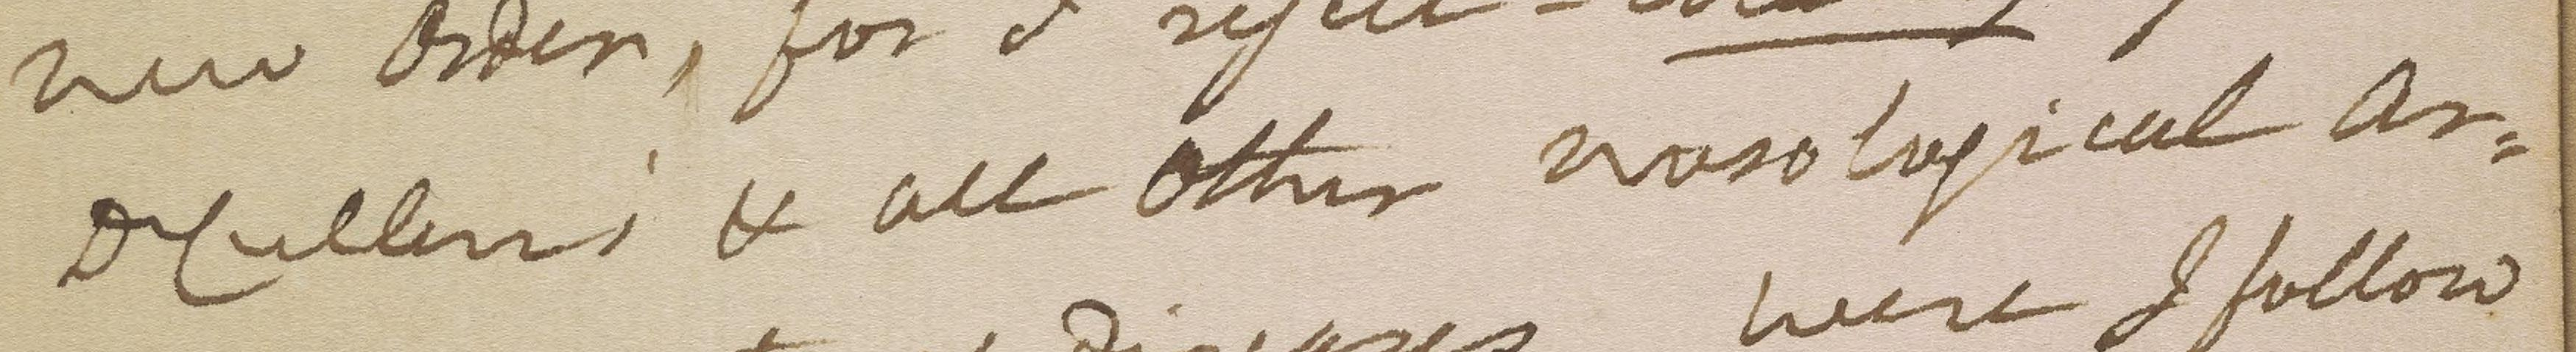Dr. Cullen's & all other nosological ar-
